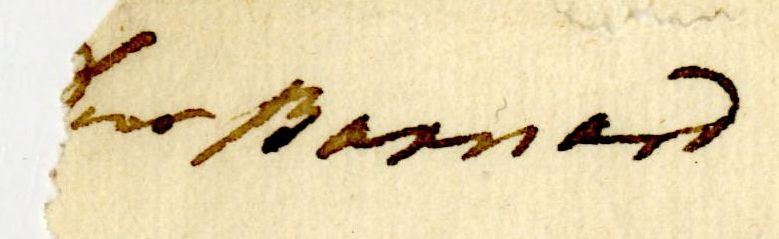Dear Barnard
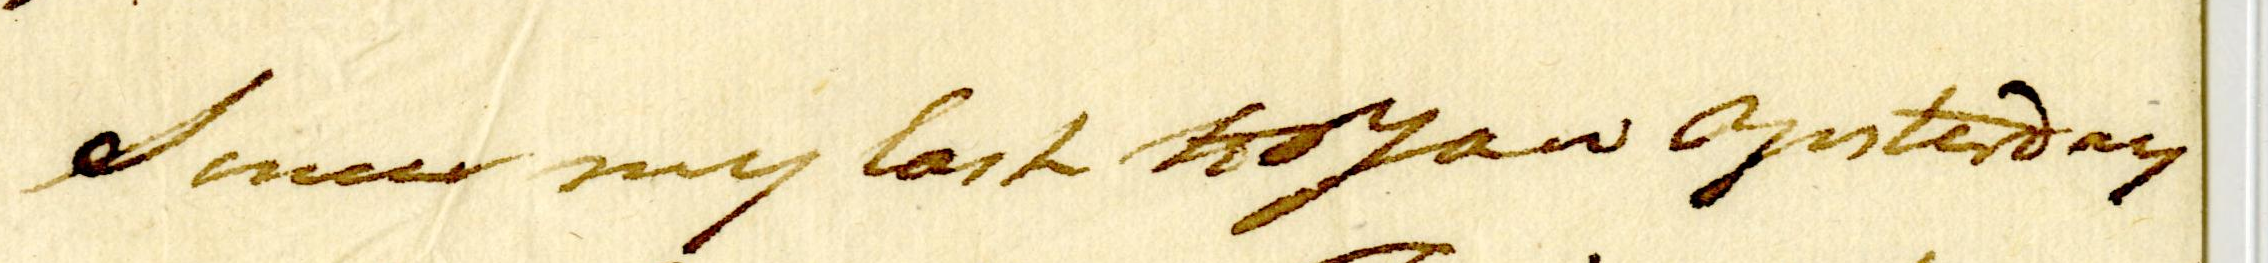Since my last to you Yesterday
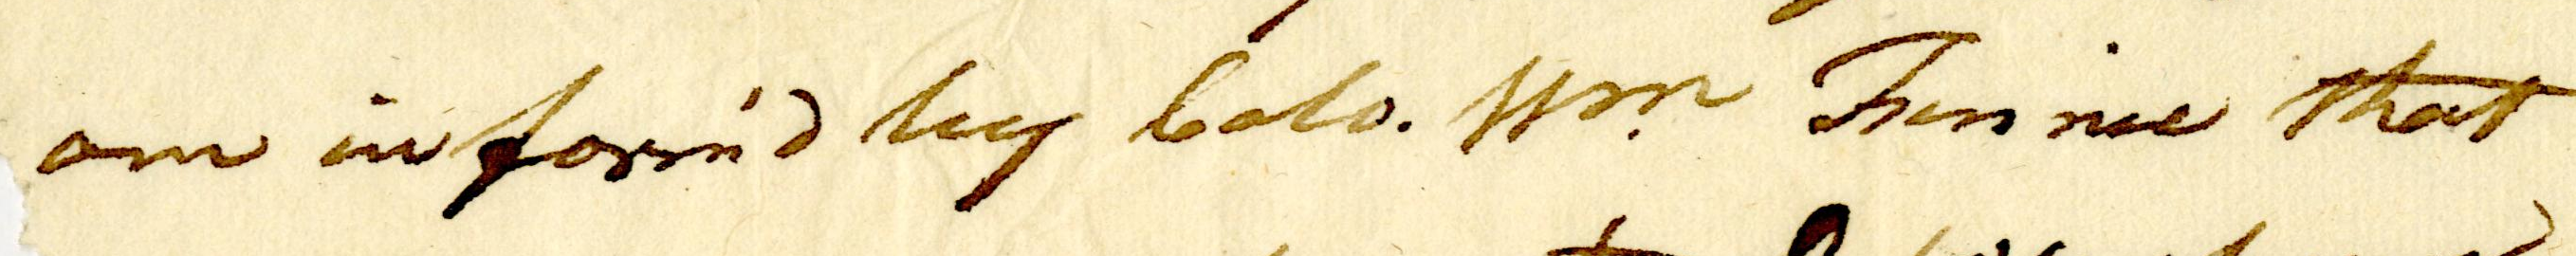am inform'd by Colo. W^m. Finnie that
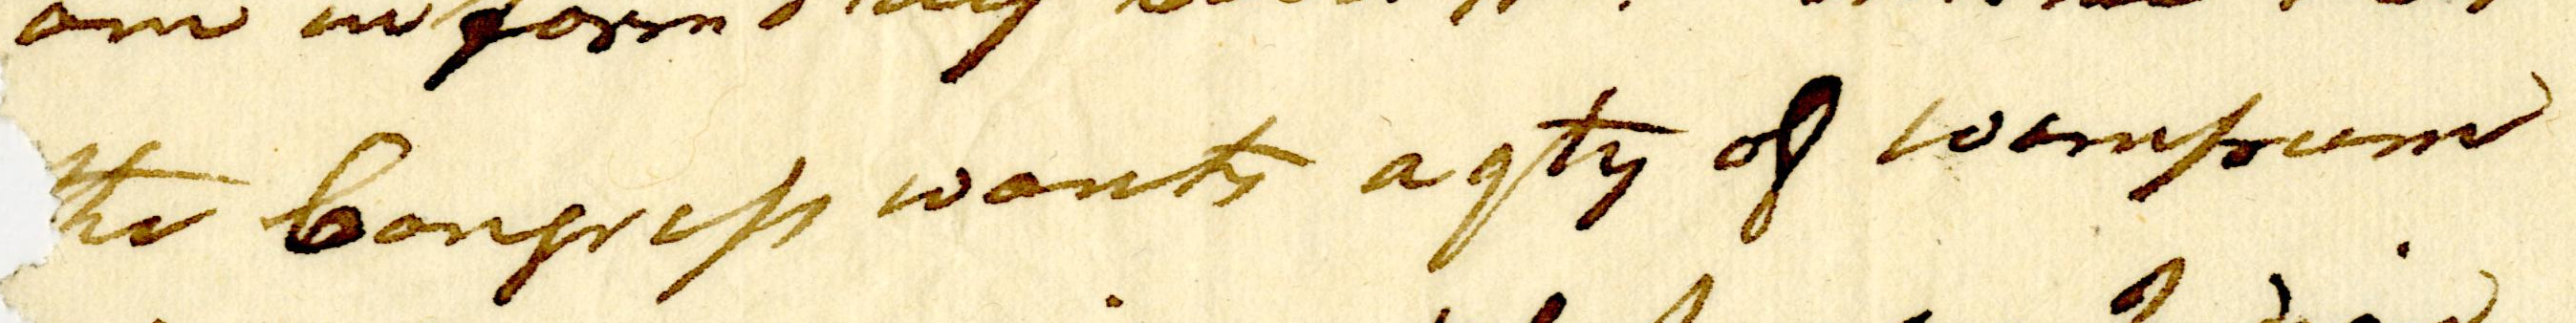the Congress wants a qty of wampum
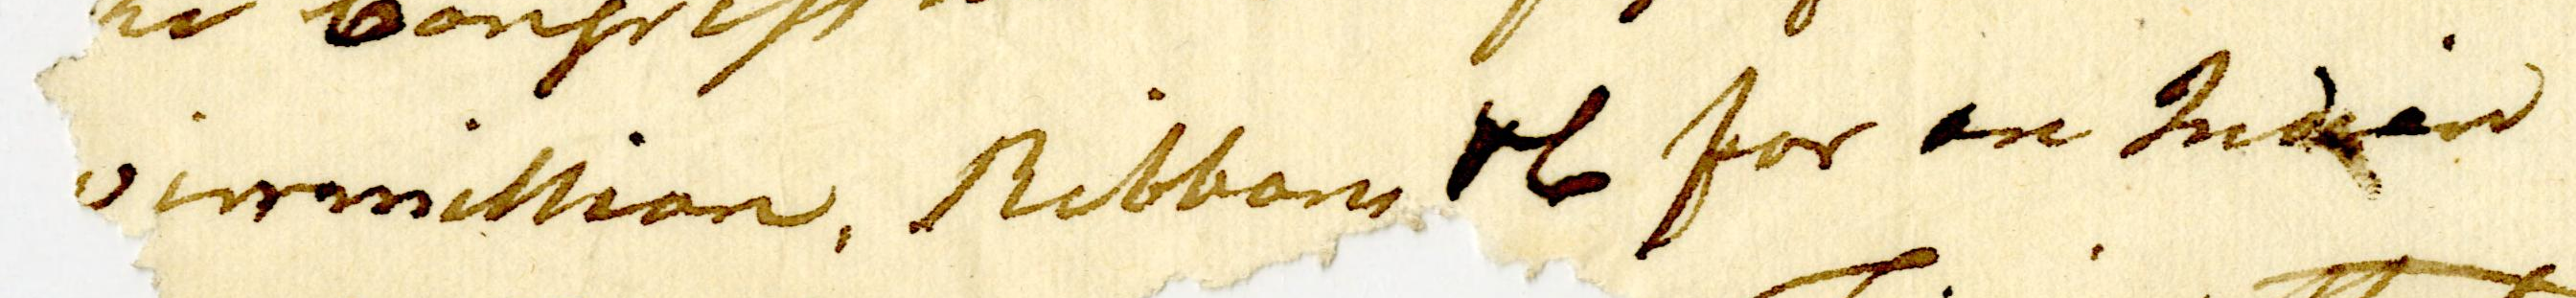virmillion, Ribbons &c for an Indian
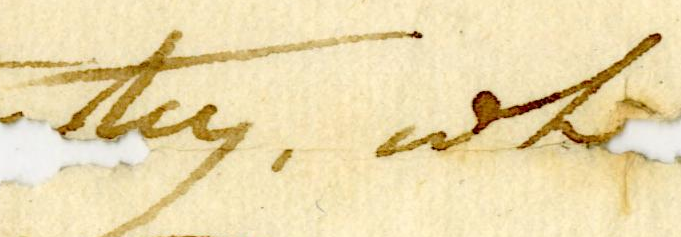try, wh
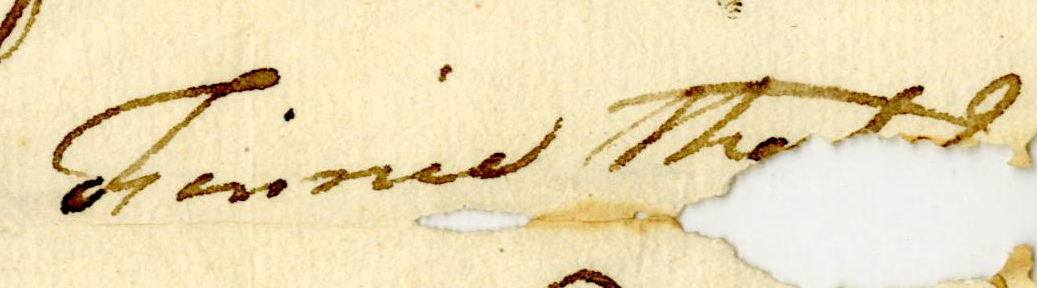Finnie that [_]
